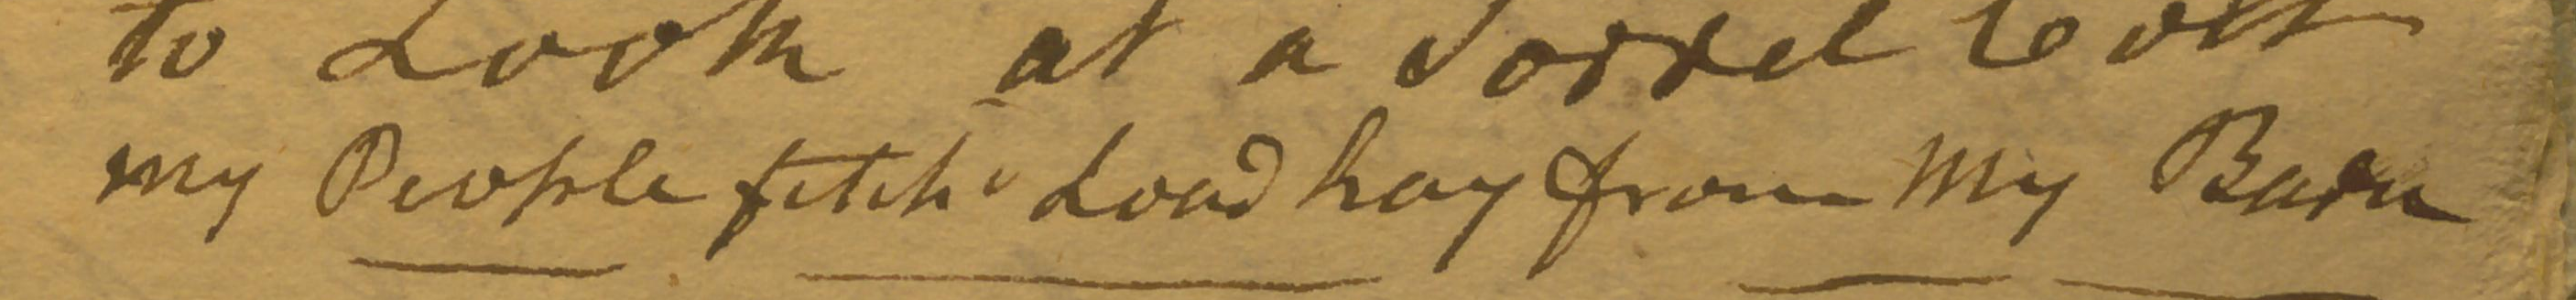my People fetch^d Load hay from My Barn
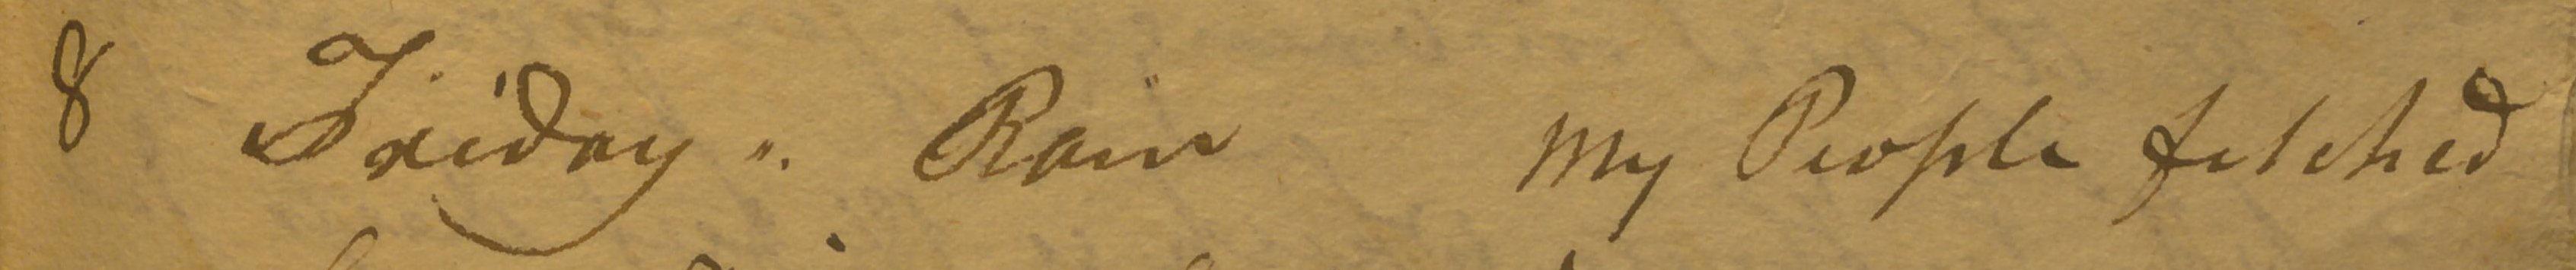8 Friday. Rain My People fetched
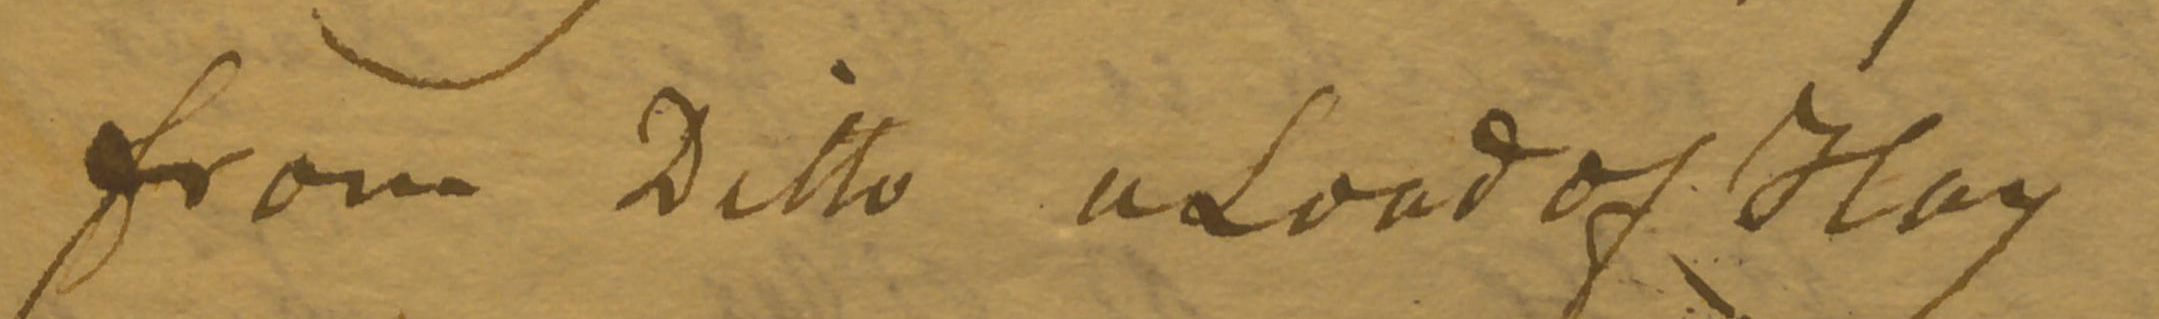from Ditto a Load of Hay
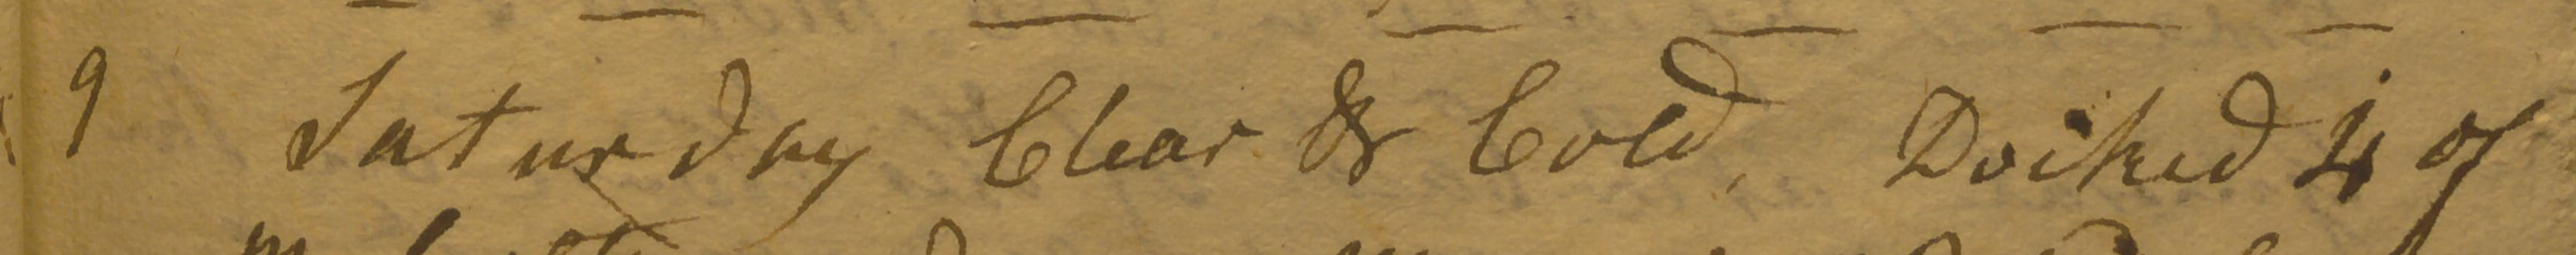9 Saturday Clear & Cold, Docked 4 of
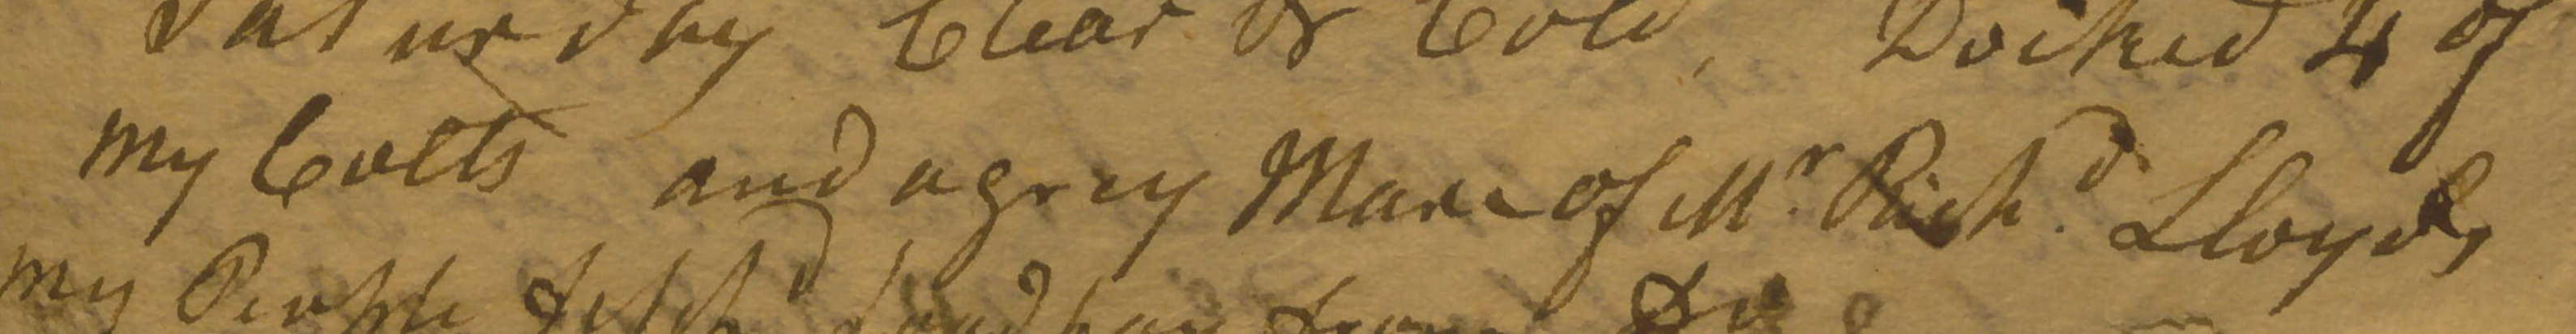my Colts and a grey Mare of M^r. Rich^d. Lloyds
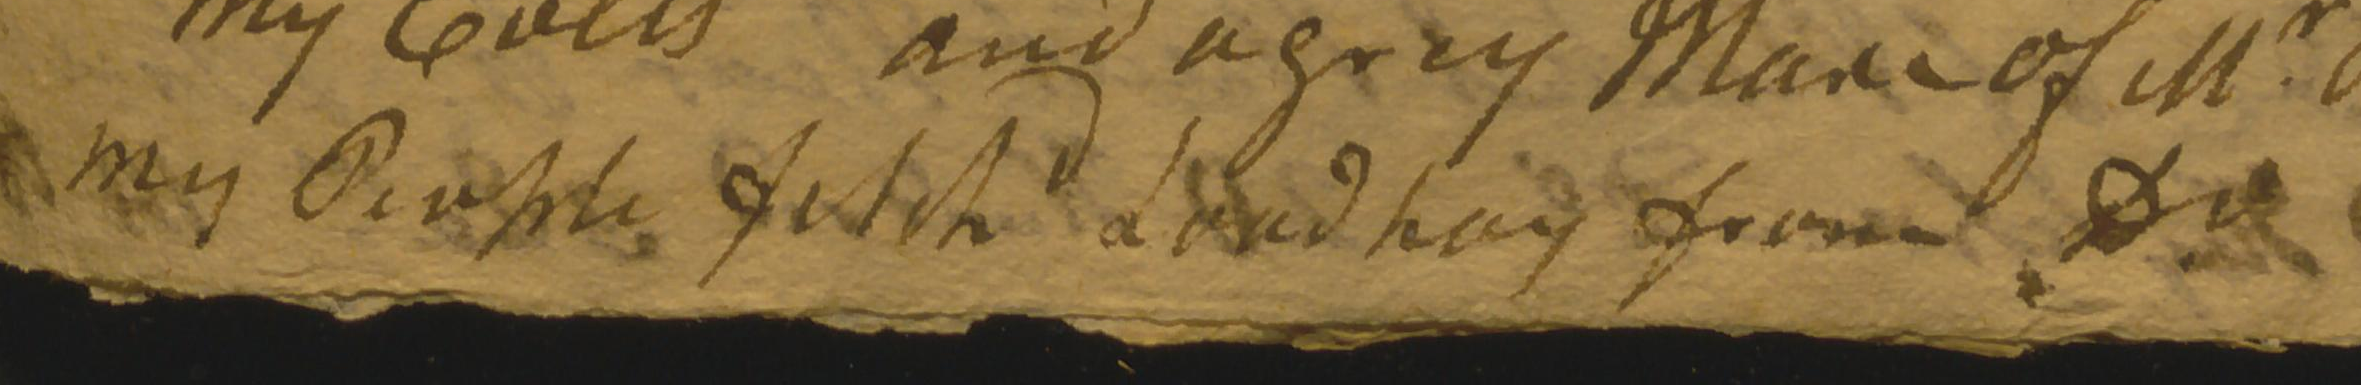My People fetch^d Load hay from D^o.
